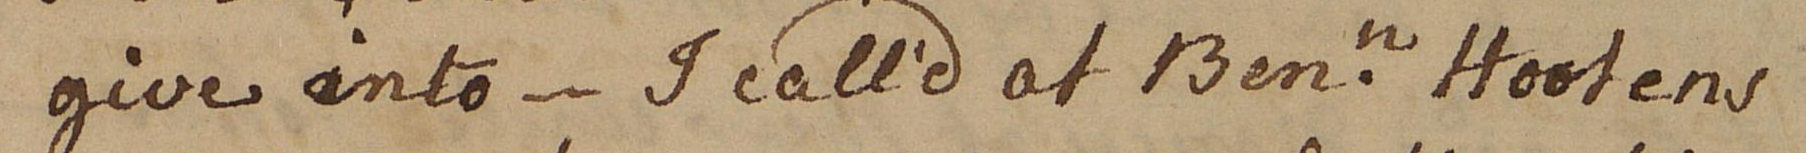give into- I call'd at Ben^n. Hootens
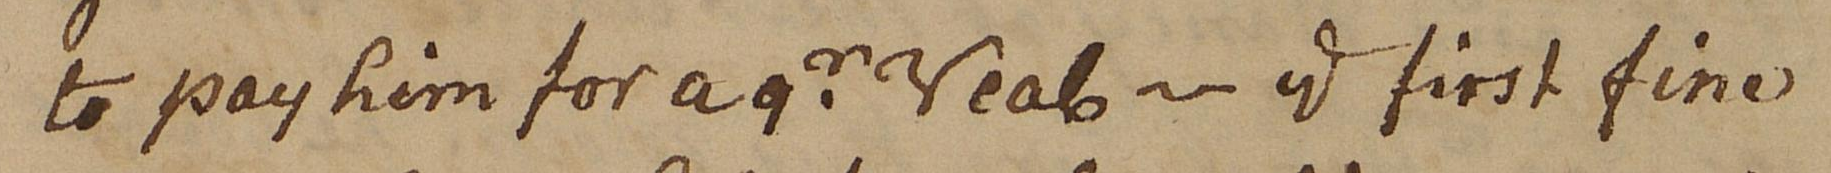to pay him for a q^r. Veal- y^e first fine
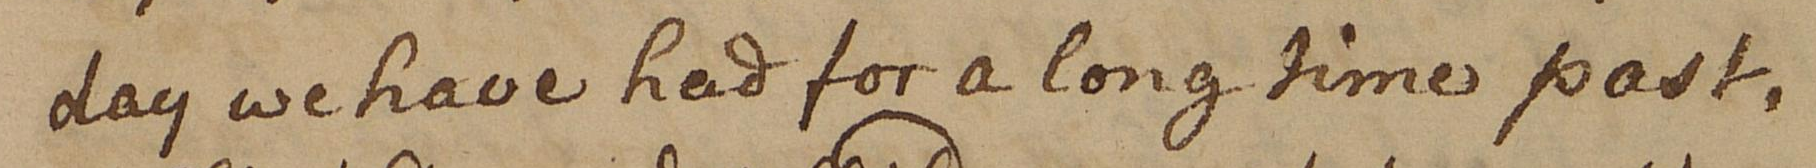day we have had for a long time past,
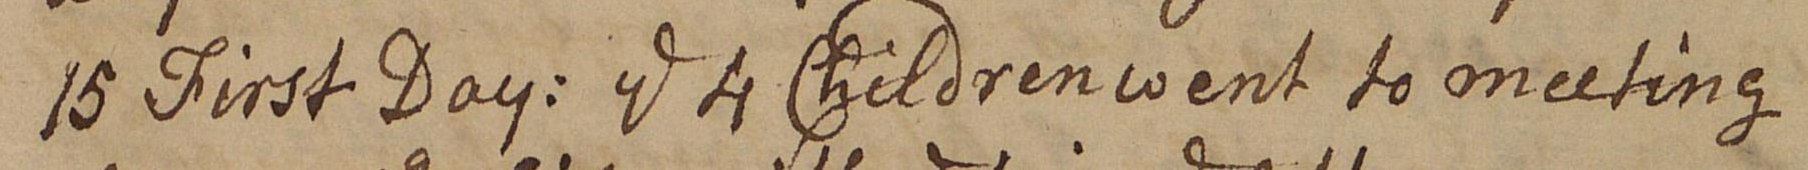15 First Day: y^e 4 Children went to meeting
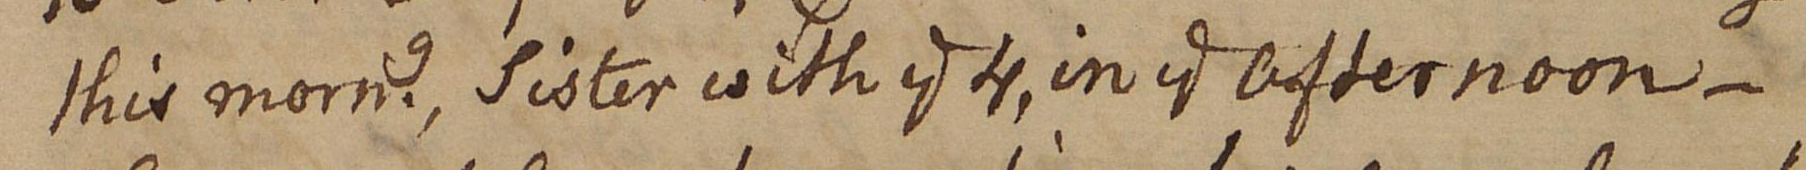this morn^g., Sister with y^e 4, in y^e afternoon-
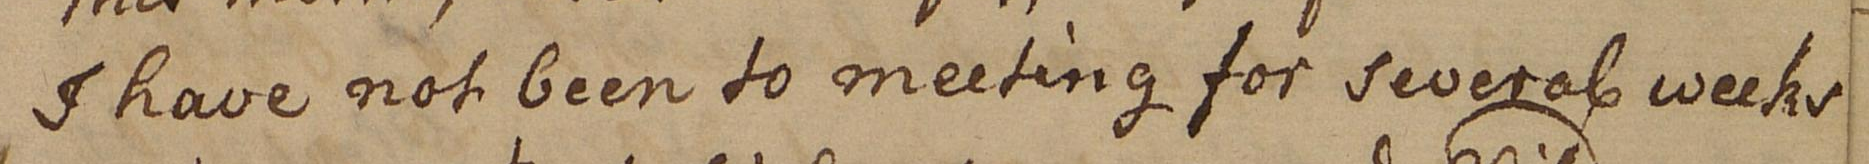I have not been to meeting for several weeks
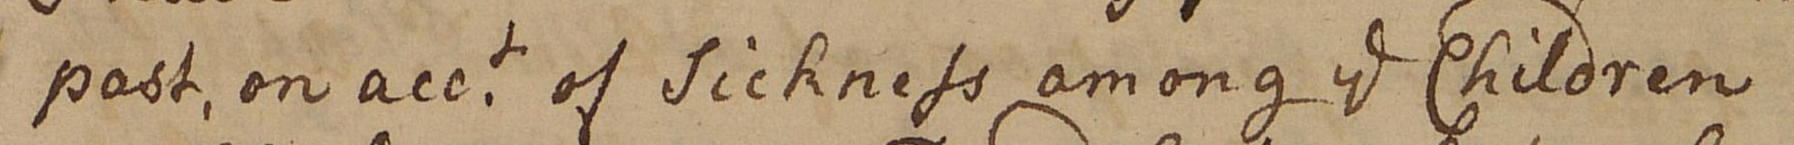past, on acc^t. of Sickness among y^e Children
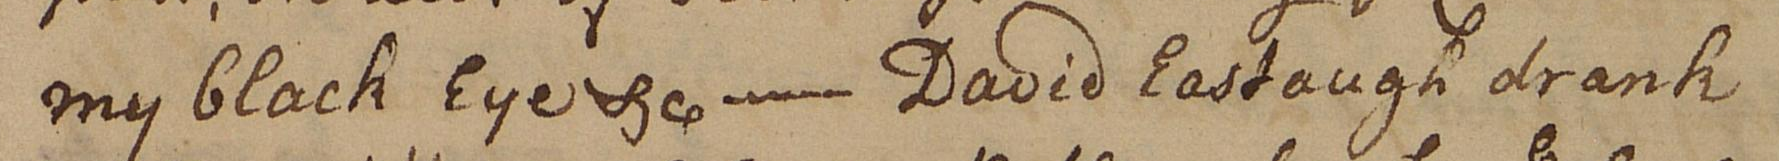my black Eye &c- David Eastaugh drank
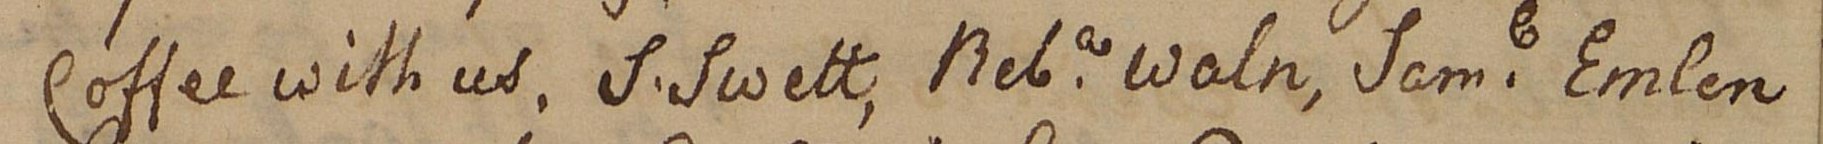Coffee with us, S. Swett, Reb^a. Waln, Sam^l. Emlen
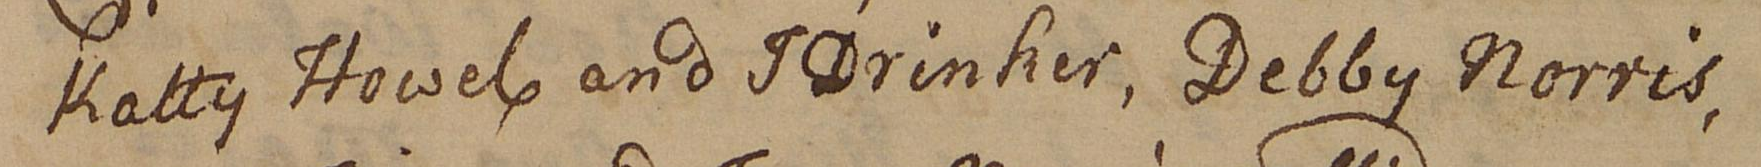Katty Howel and J Drinker, Debby Norris,
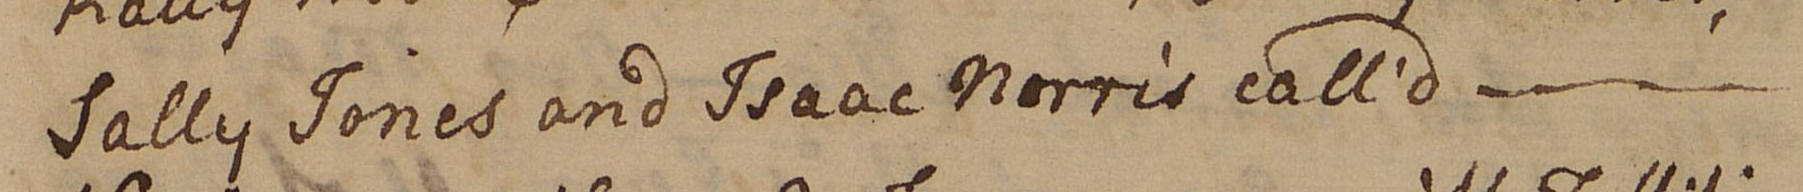Sally Jones and Isaac Norris call'd-
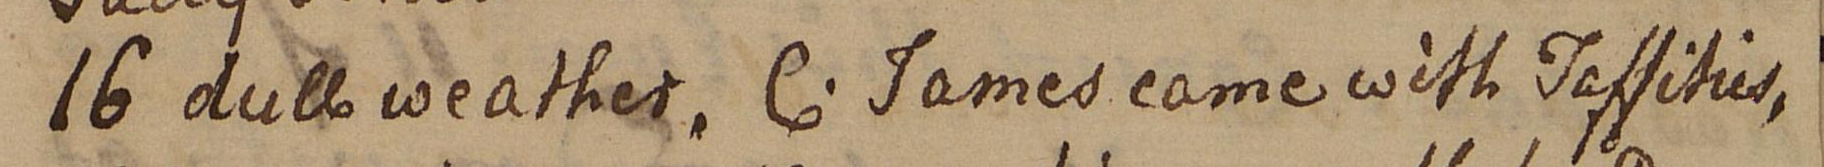16 dull weather, C. James came with Taffities,
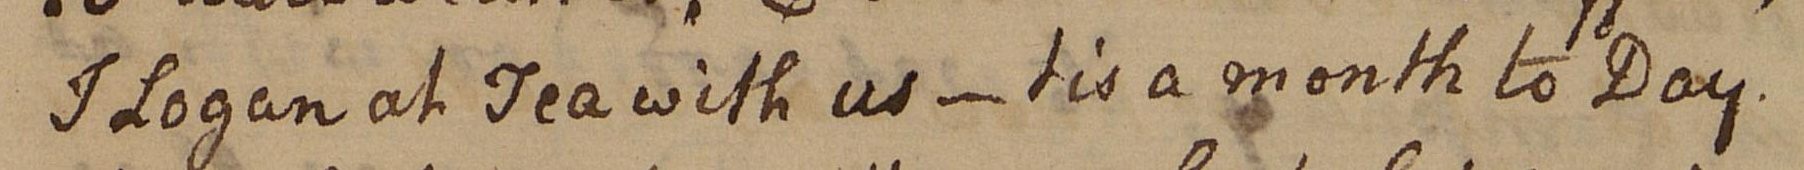J Logan at Tea with us- tis a month to Day.
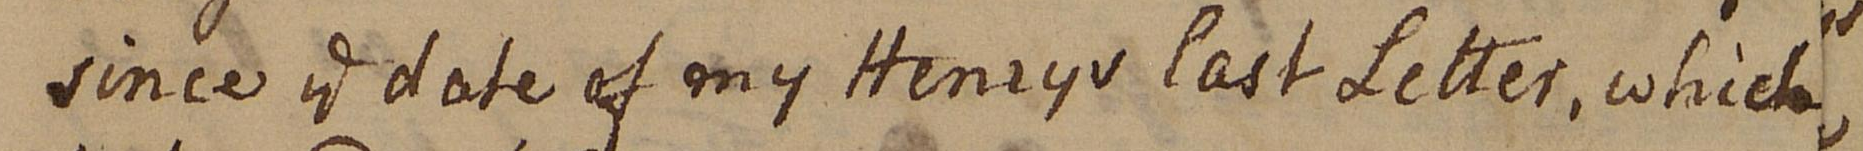since y^e date of my Henrys last Letter, which
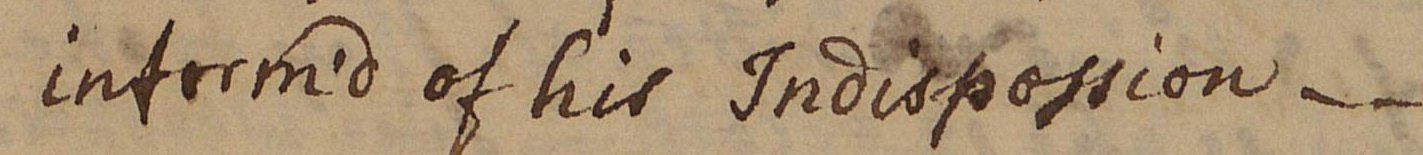inform'd of his Indispossion-
